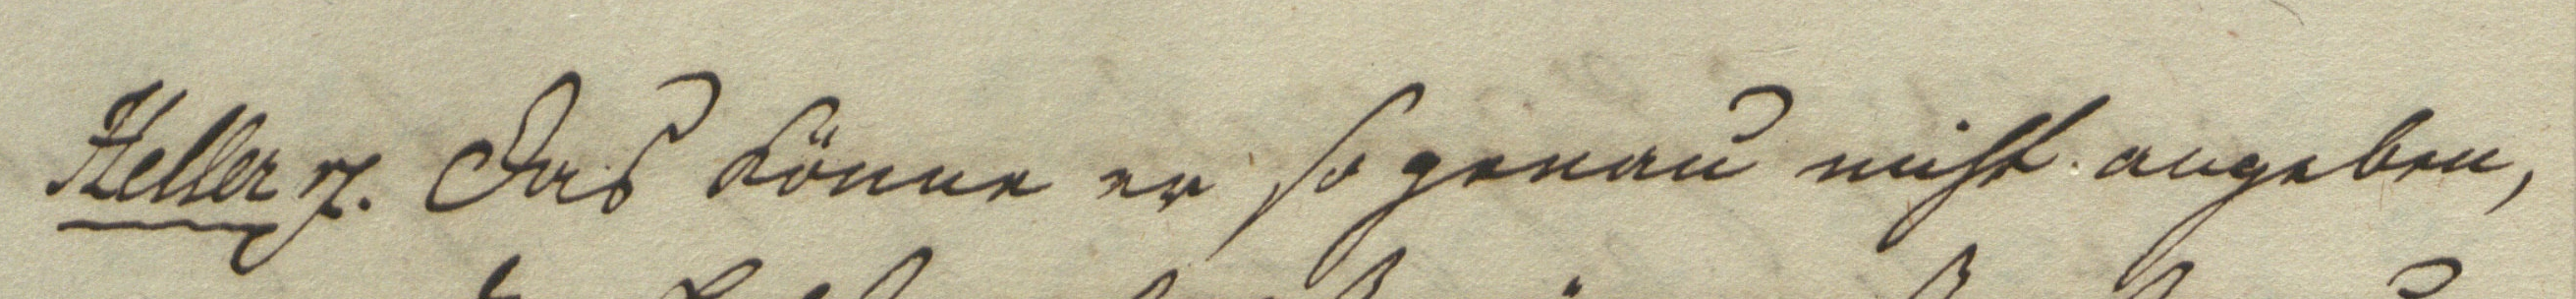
Heller rf. Das könne er so genau nicht angeben,
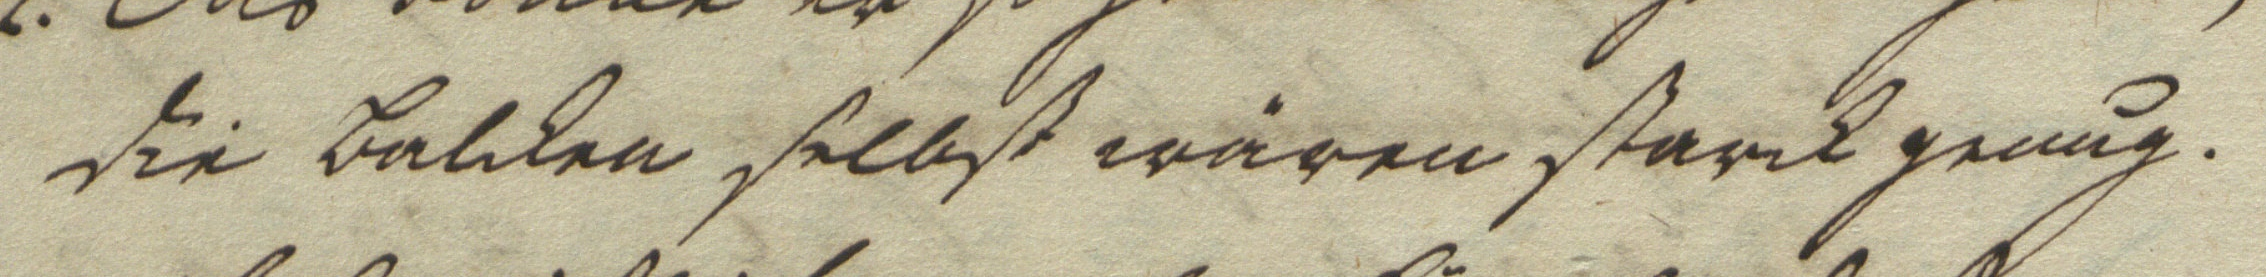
die Balcken selbst wären starck genug.
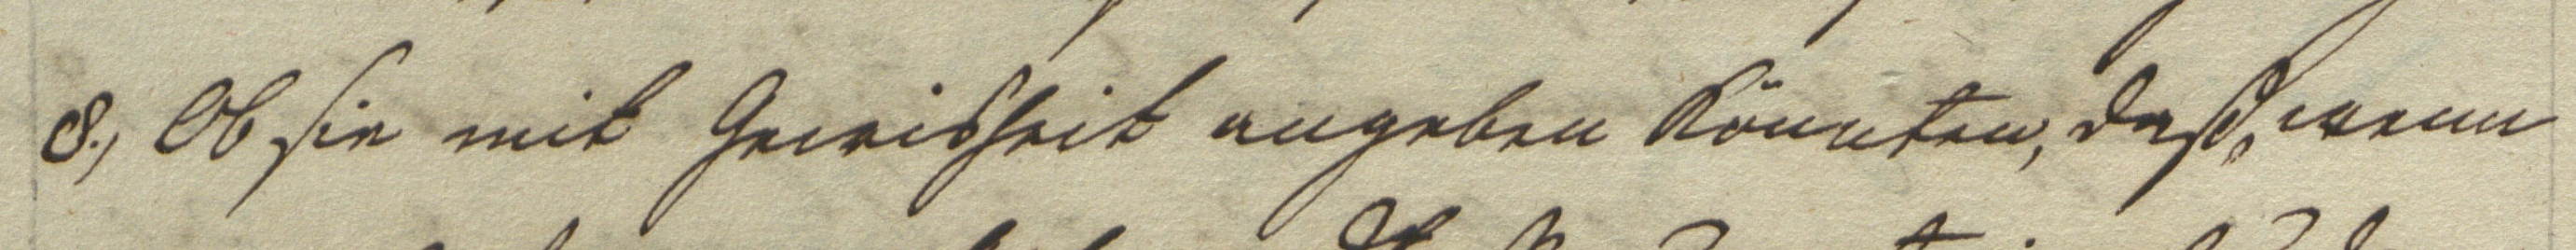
8, Ob sie mit Gewisheit angeben könnten, daß, wenn
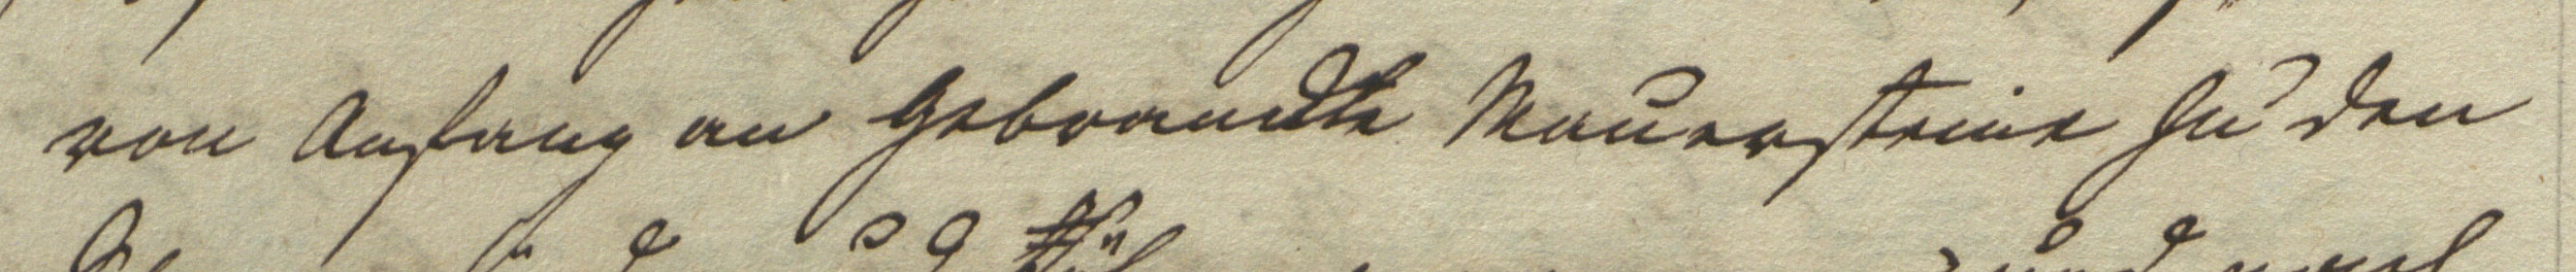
von Anfang an gebrandte Mauersteine zu den
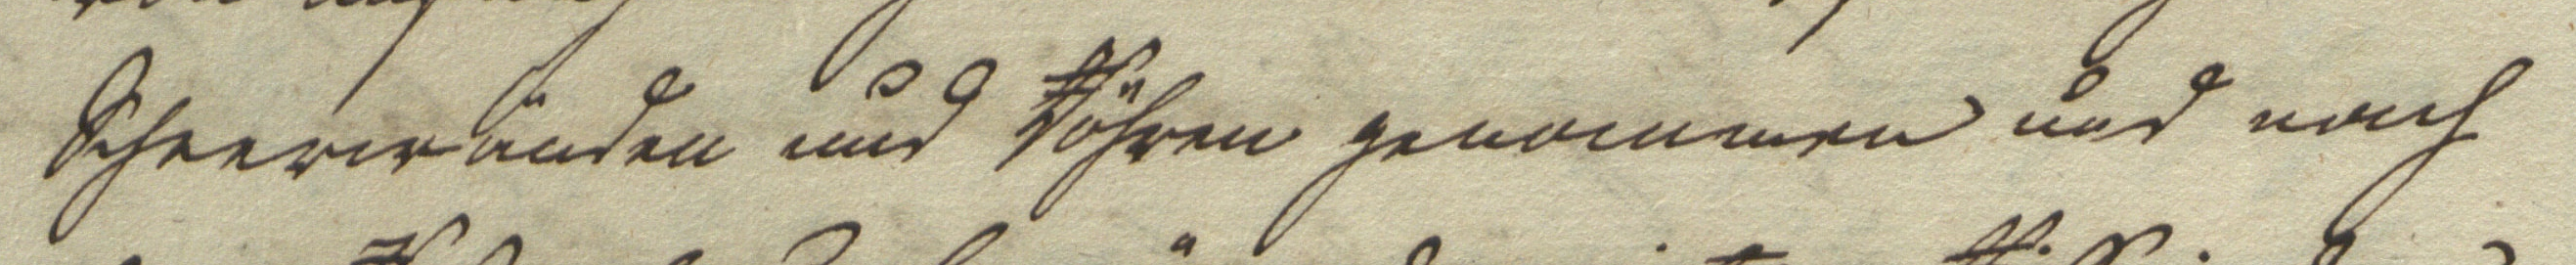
Scheerwänden und Röhren genommen und nach
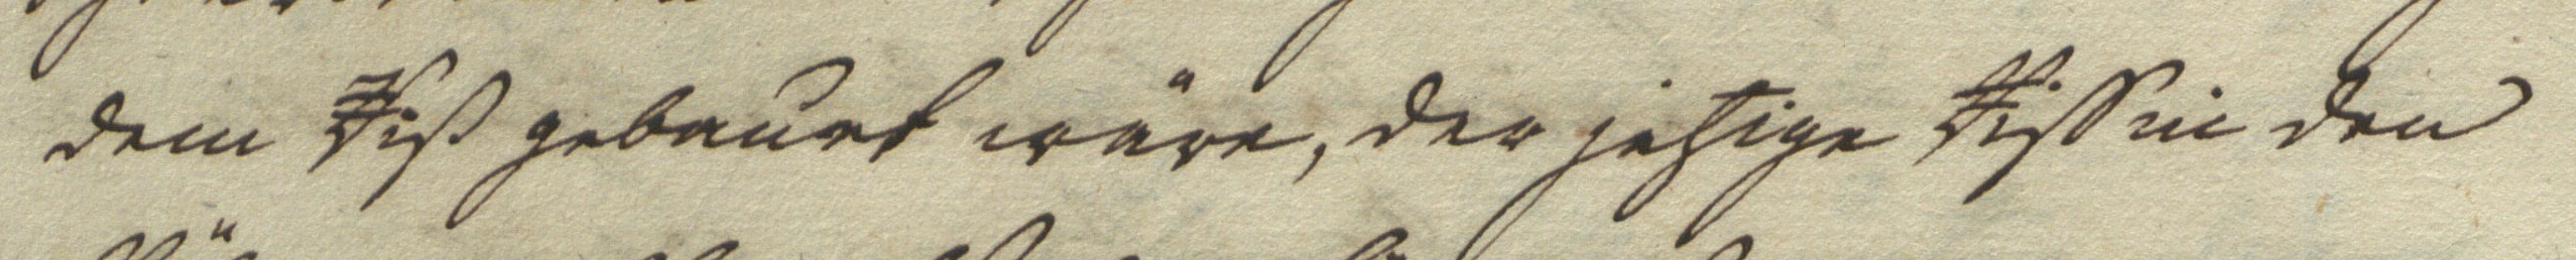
dem Riß gebauet wäre, der jetzige Riß in den
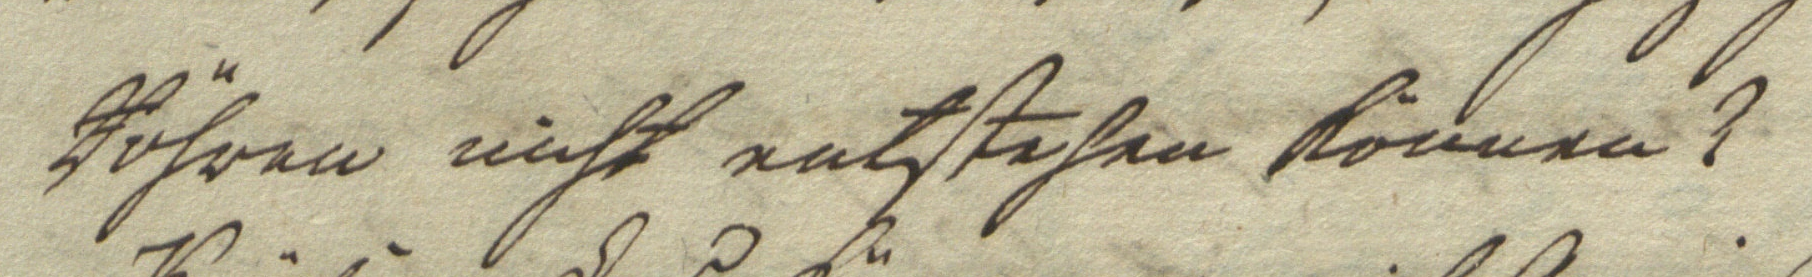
Röhren nicht entstehen können?
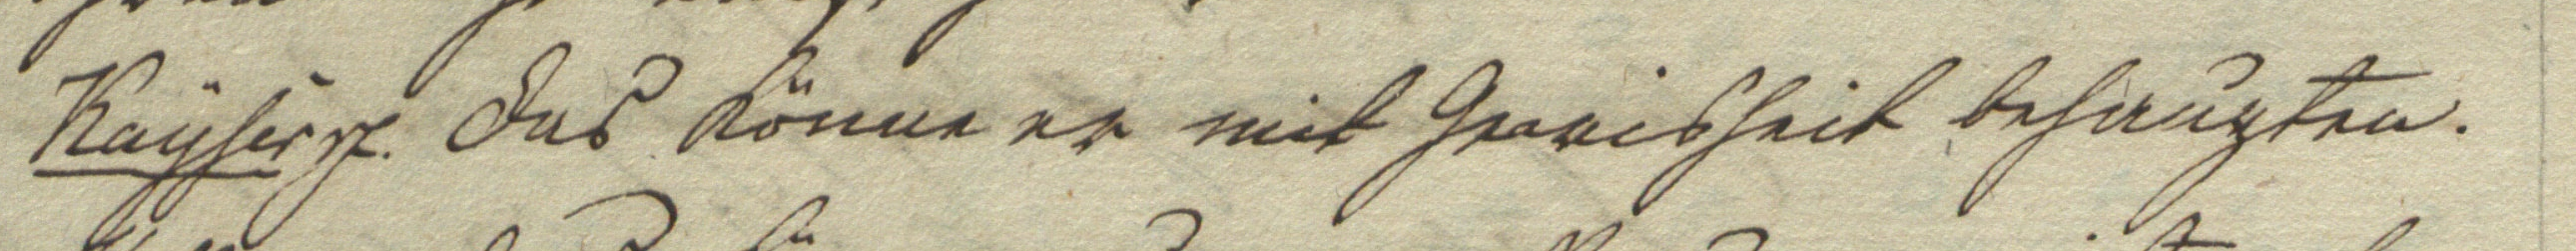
Kaÿser rf. Das könne er mit Gewisheit behaupten.
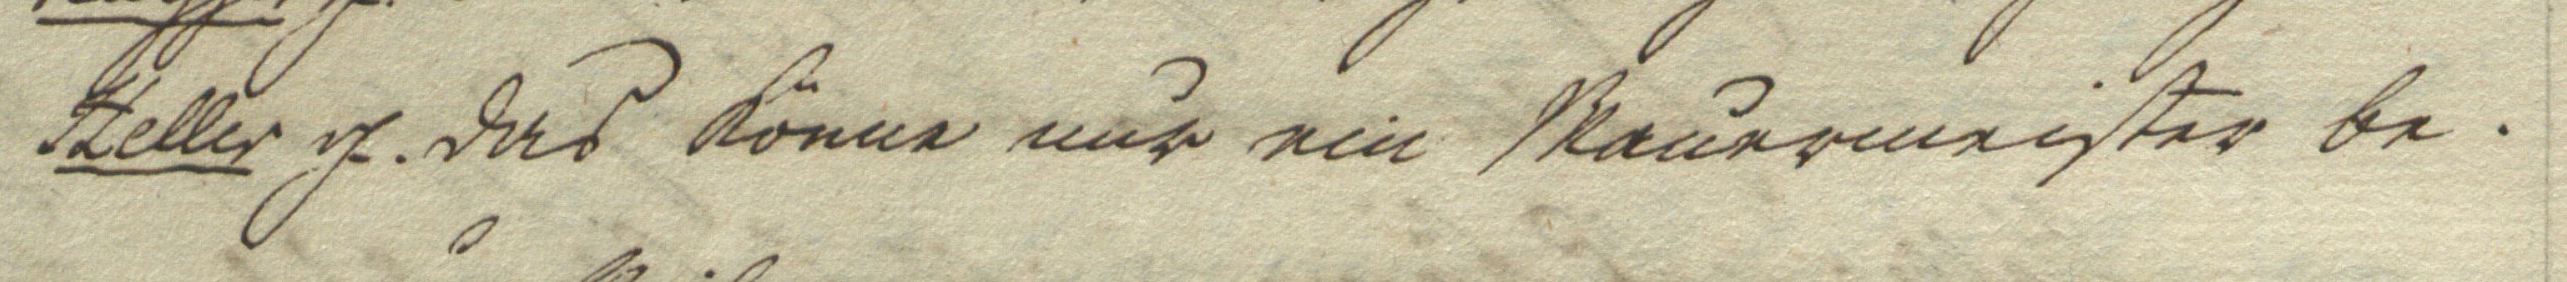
Heller rf. Das könne nur ein Mauermeister be¬
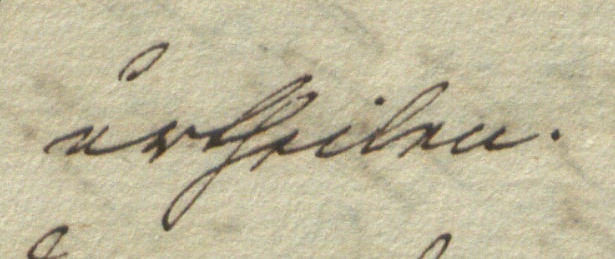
urtheilen.
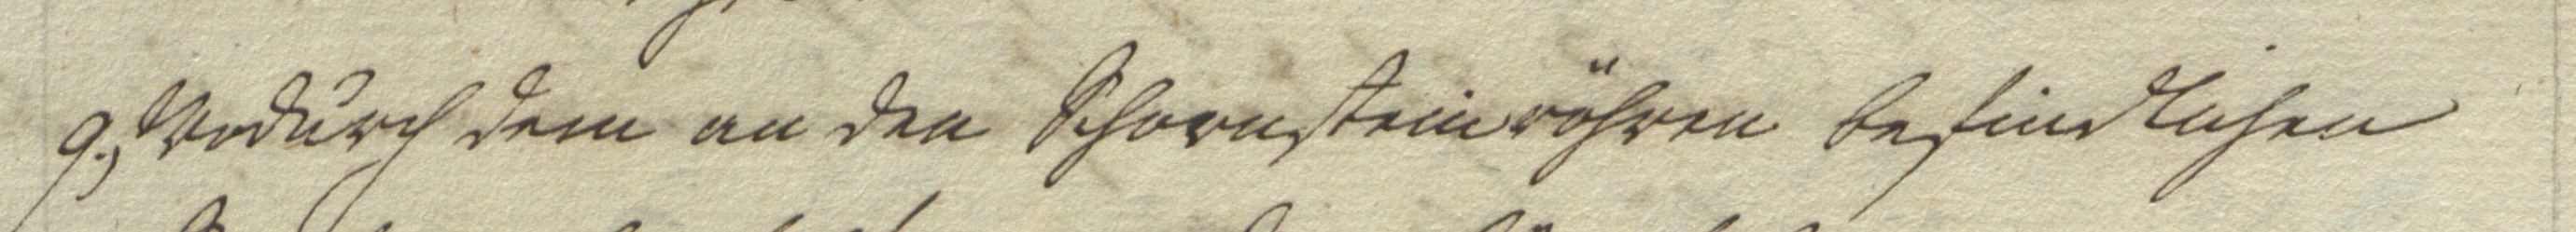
9., Wodurch dem an den Schornsteinröhren befindlichen
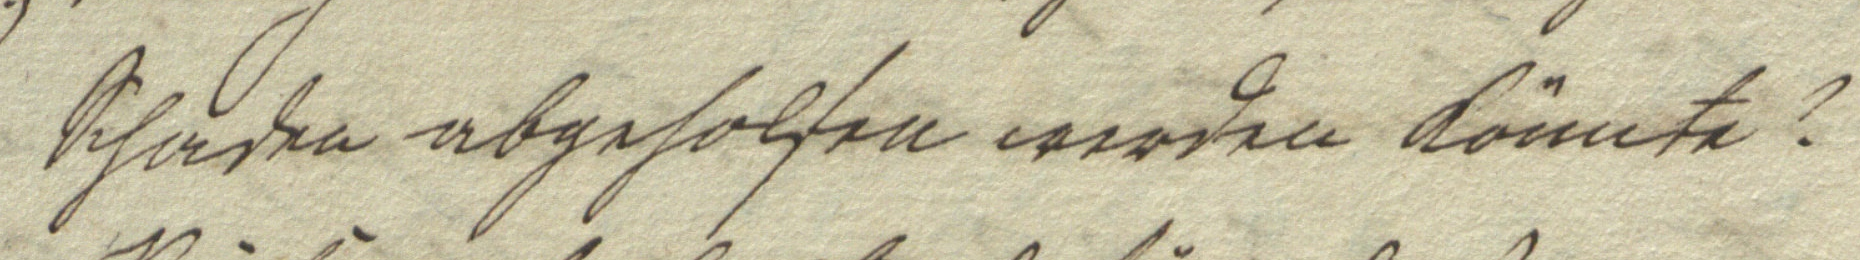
Schaden abgeholfen werden könnte?
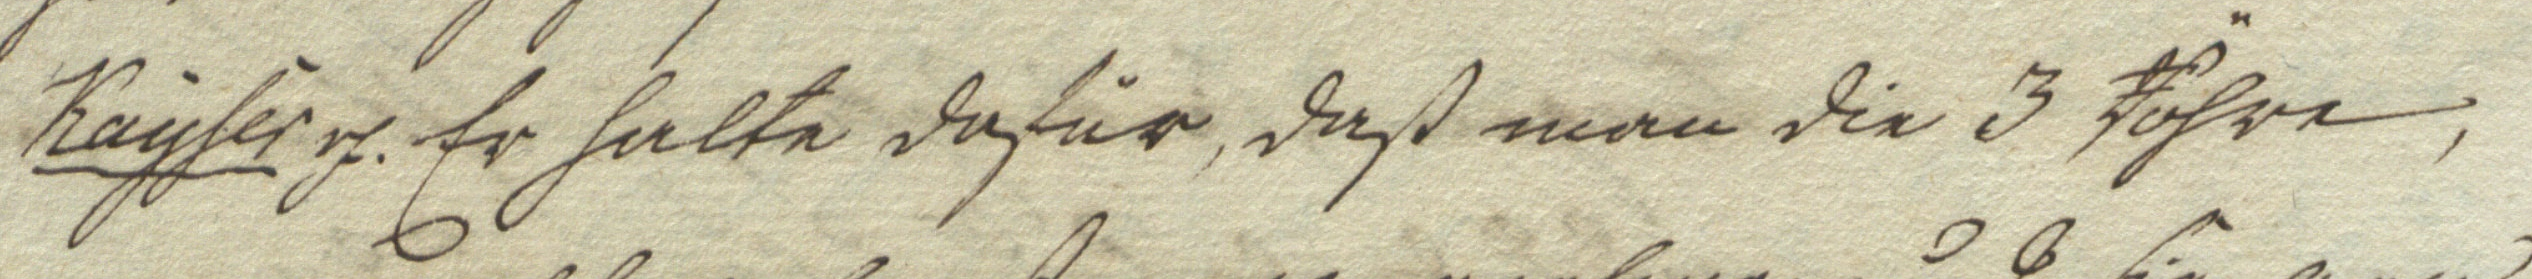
Kaÿser rf. Er halte dafür, daß man die 3 Röhre,
